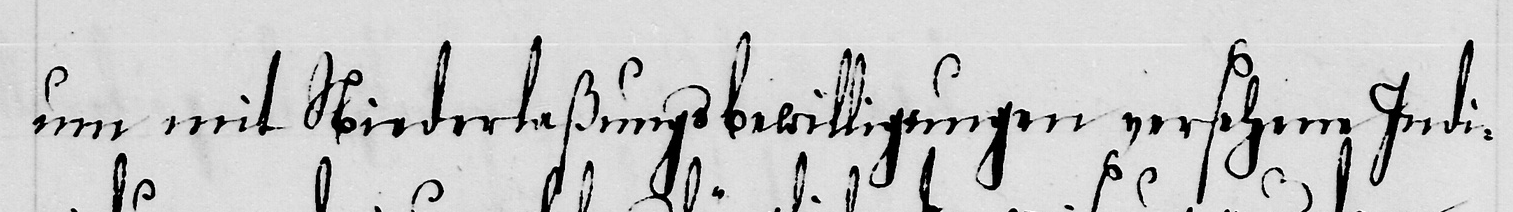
um mit Niederlaßungsbewilligungen versehene Indi¬
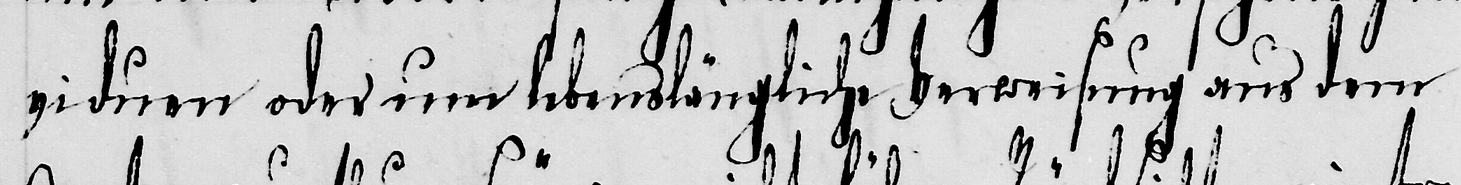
viduen oder um lebenslängliche Verweisung aus dem
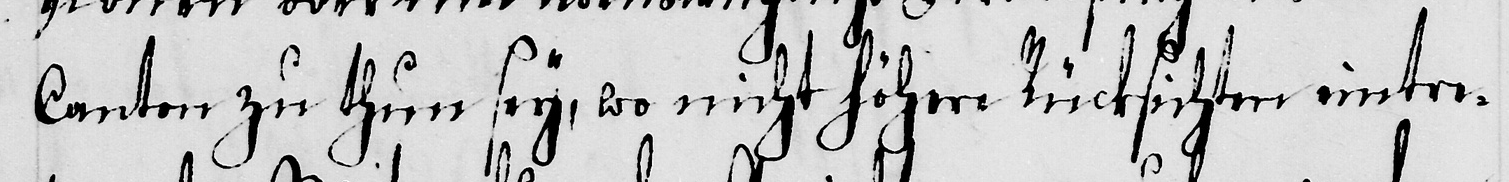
Canton zu thun sey, wo nicht höhere Rücksichten eintre¬
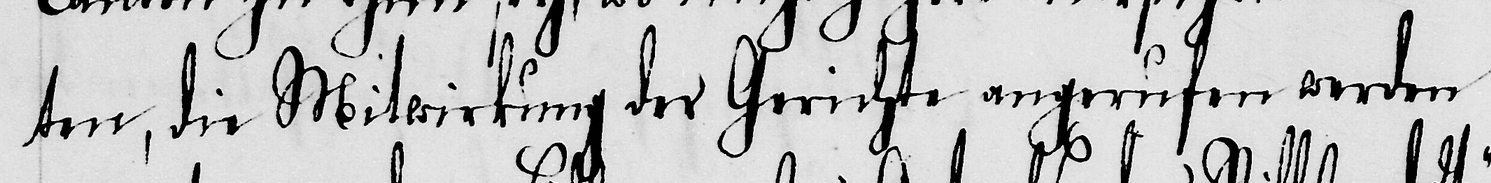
ten, die Mitwirkung der Gerichte angerufen werden
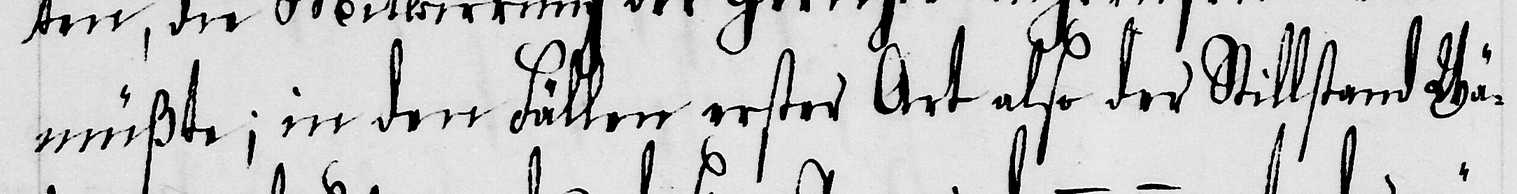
müßte; in den Fällen erster Art also der Stillstand Wä¬
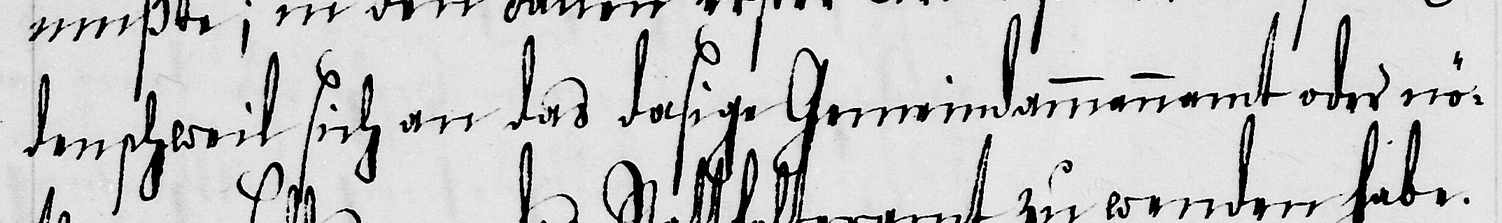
denschweil sich an das dasige Gemeindammannamt oder nö¬
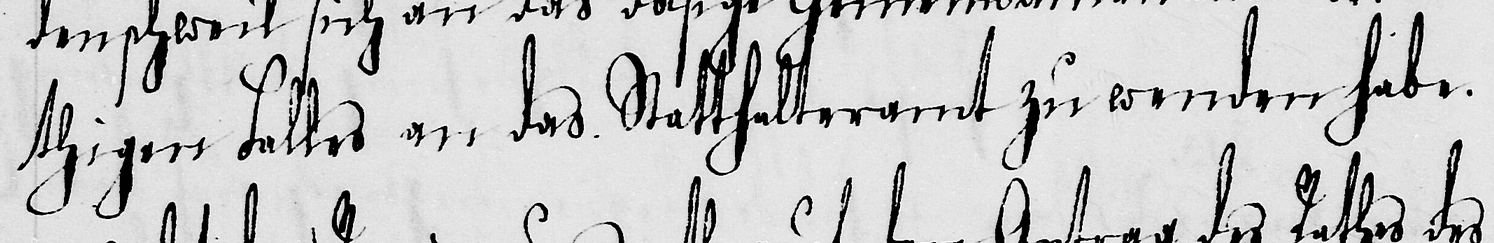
thigen Falles an das Statthalteramt zu wenden habe.
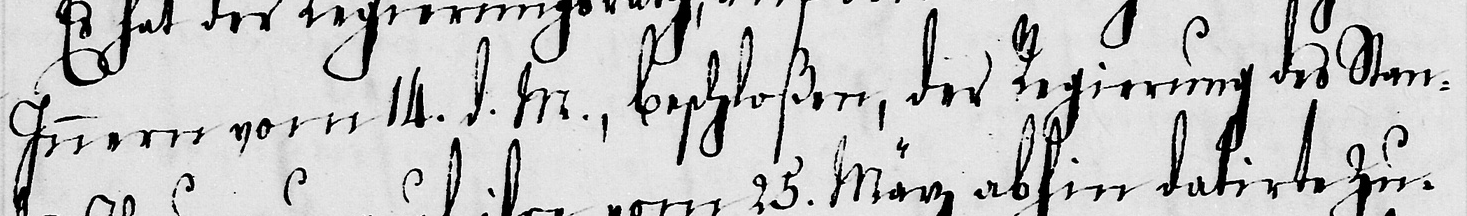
Innern vom 14. d. M., beschloßen, der Regierung des Stan¬
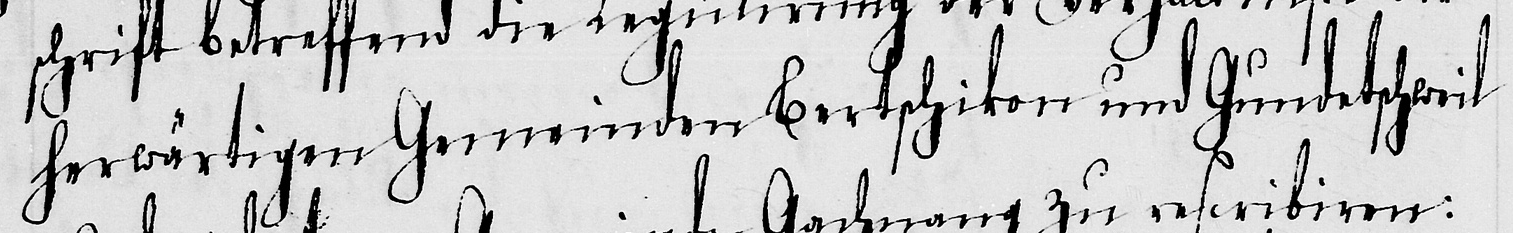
herwärtigen Gemeinden Bertschikon und Gutetschweil
